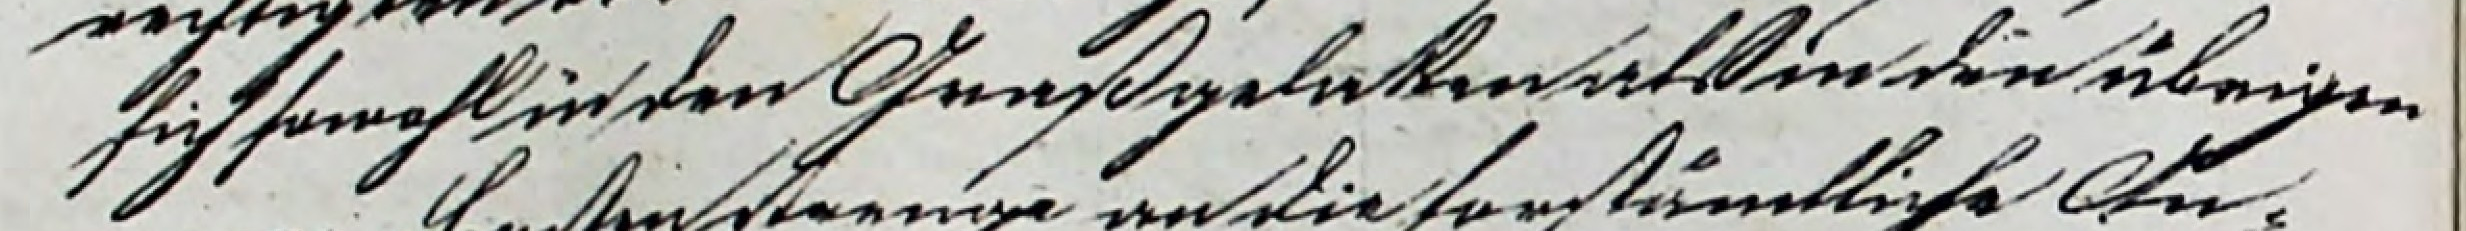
sich sowohl in den Graßgelaken als in den übrigen
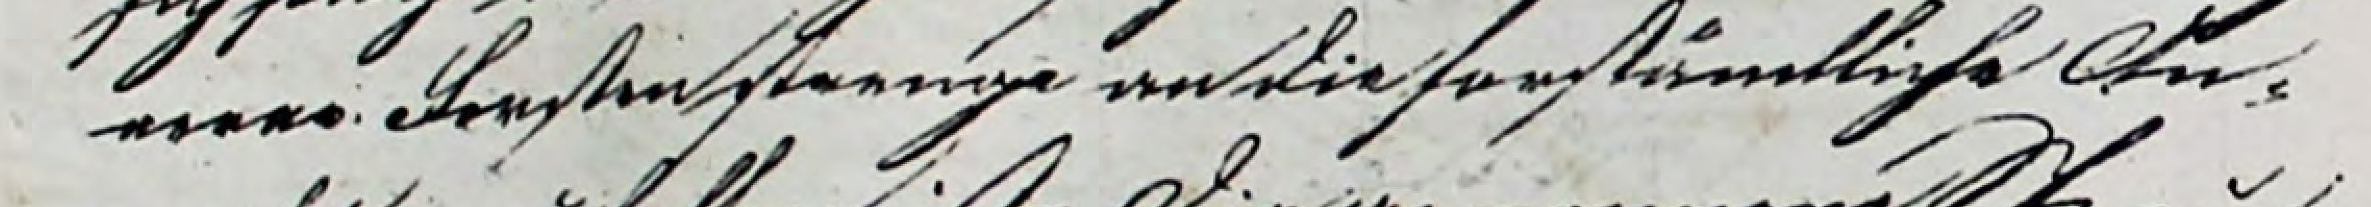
??? Forstenstrenge an die forstämtliche An„
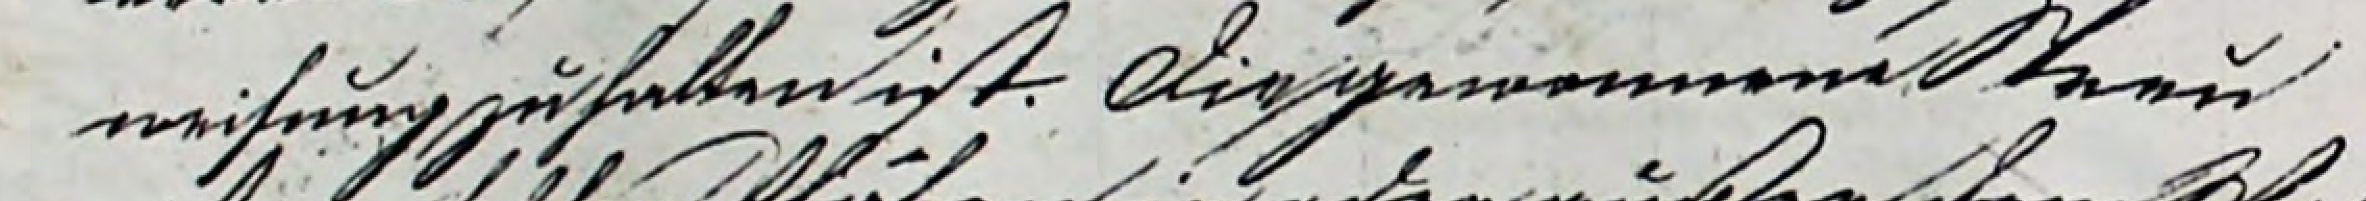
weisung zu fallen ist. Die gewonnene Streu
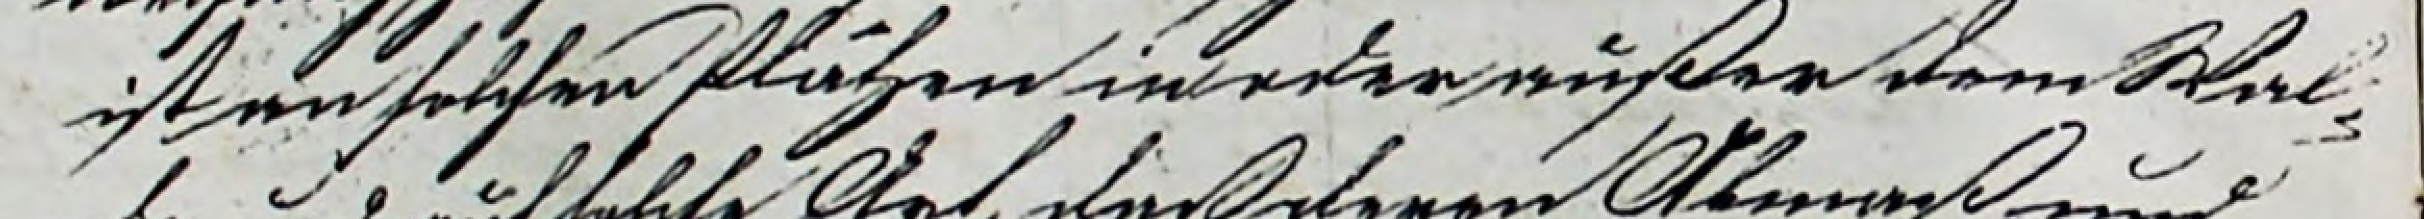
ist an solchen Plätzen in oder außer dem Wal„
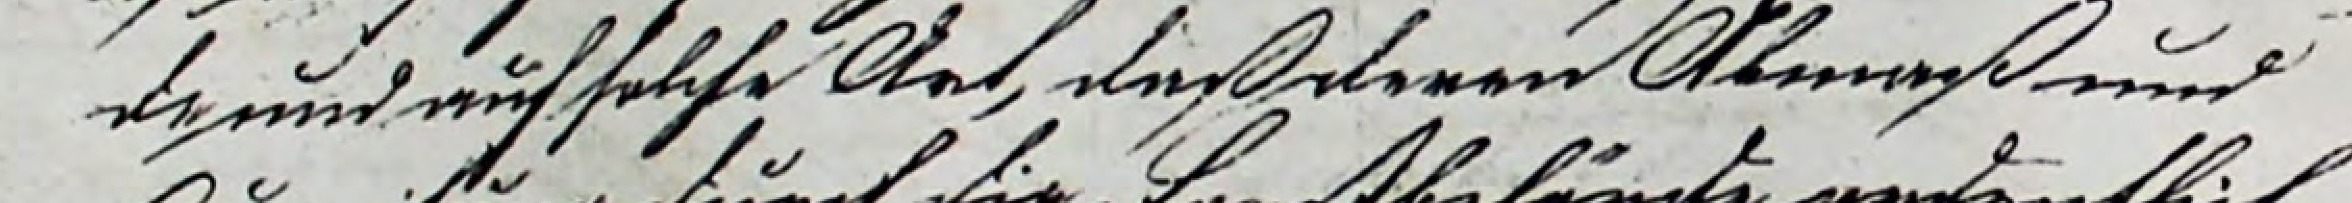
de und auf solche Art, deß deren Abmaß und
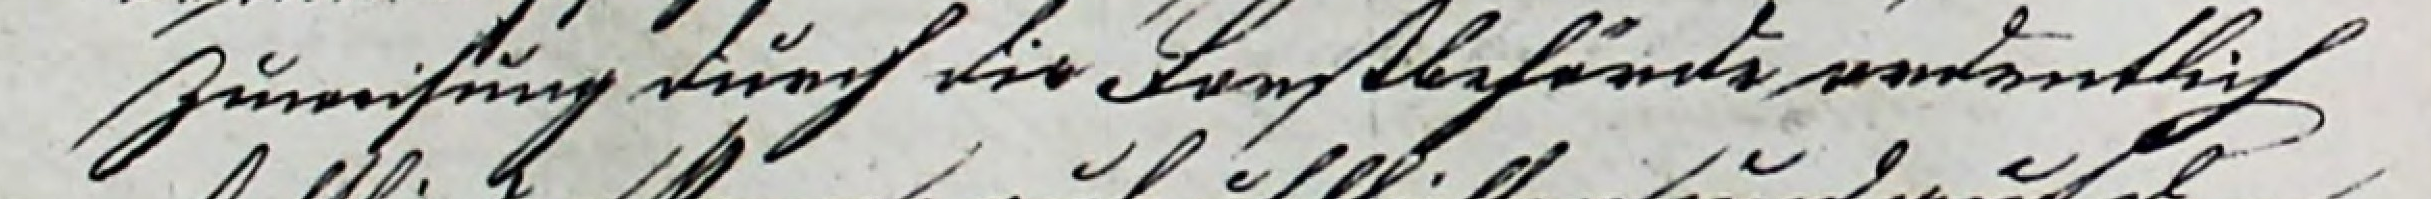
Zuweisung durch die Forstbehörde ordentlich
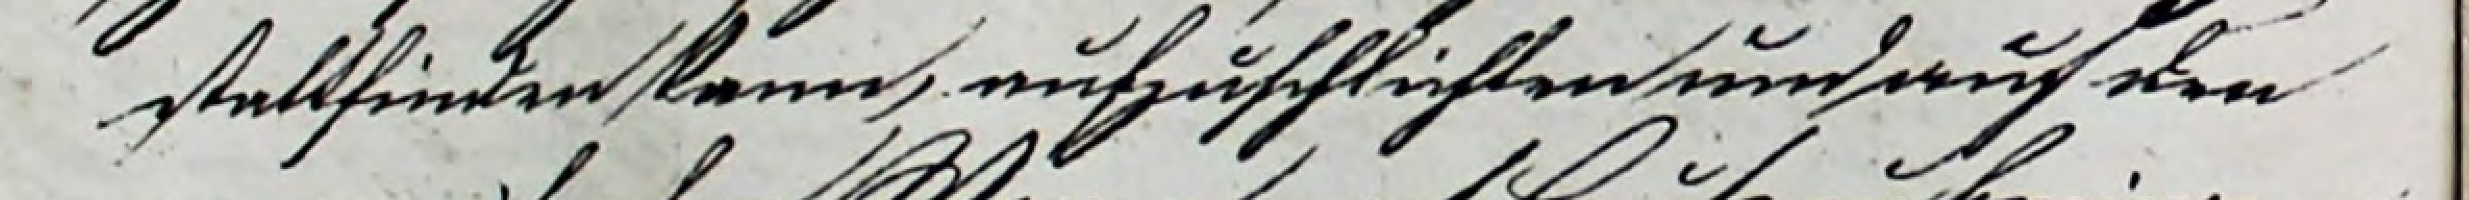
stattfinden kann, aufzuschlichten und auf den
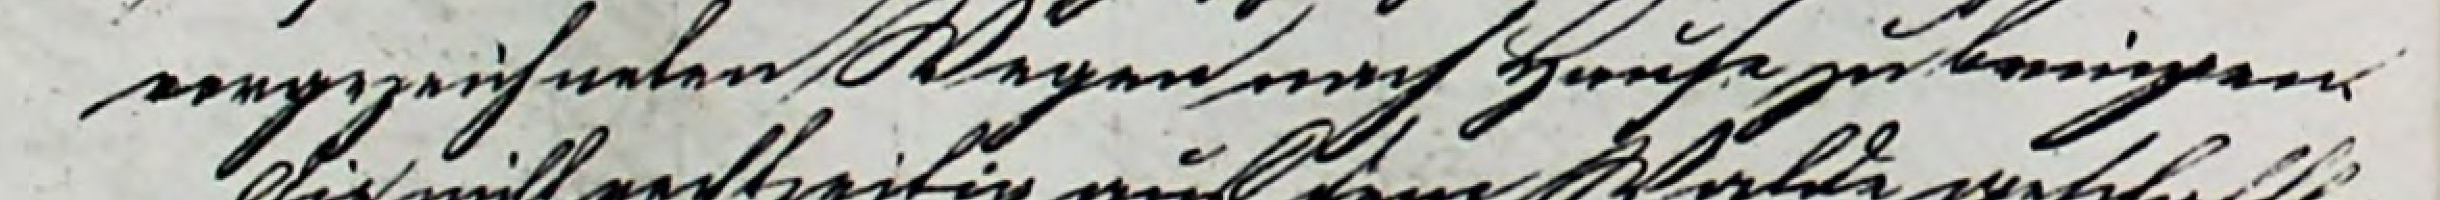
vorgezeich neben Wegen nach Hause zu bringen
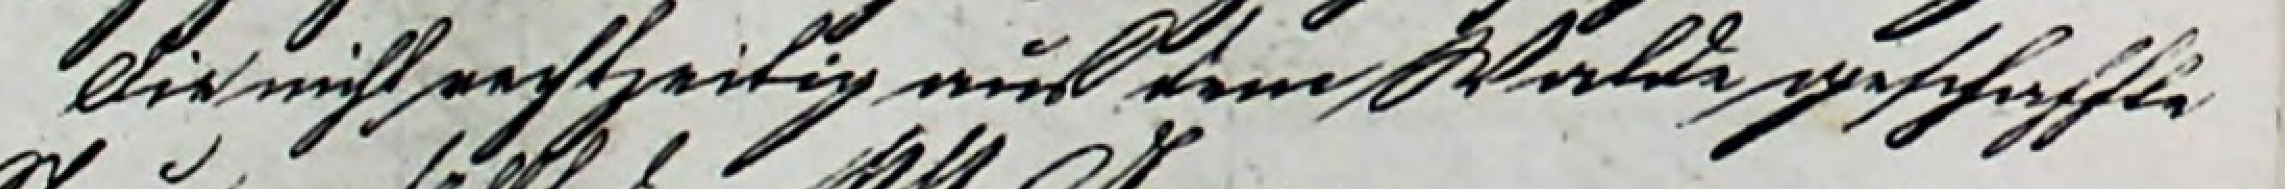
Die nicht rechtzeitig aus dem Walde geschaffte
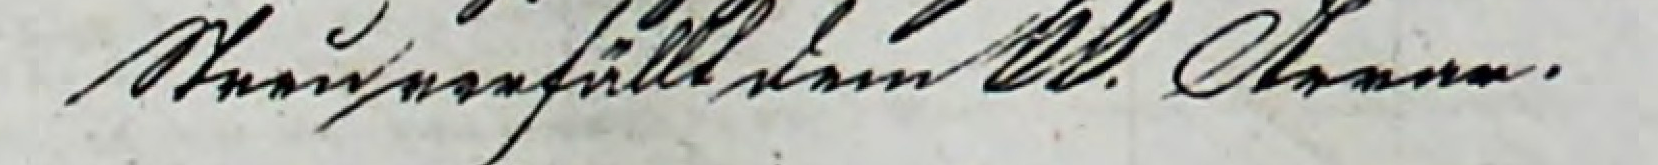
Streu verfüllt dem kk. Aerar.
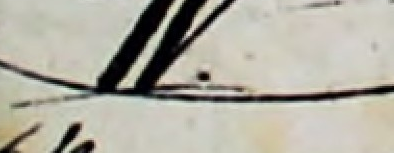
IV.
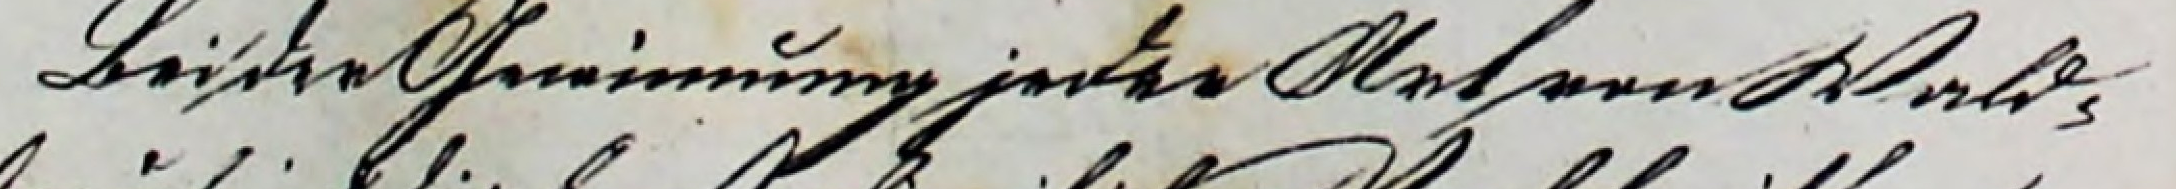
Bei der Gewinnung jeder Art von Wald„
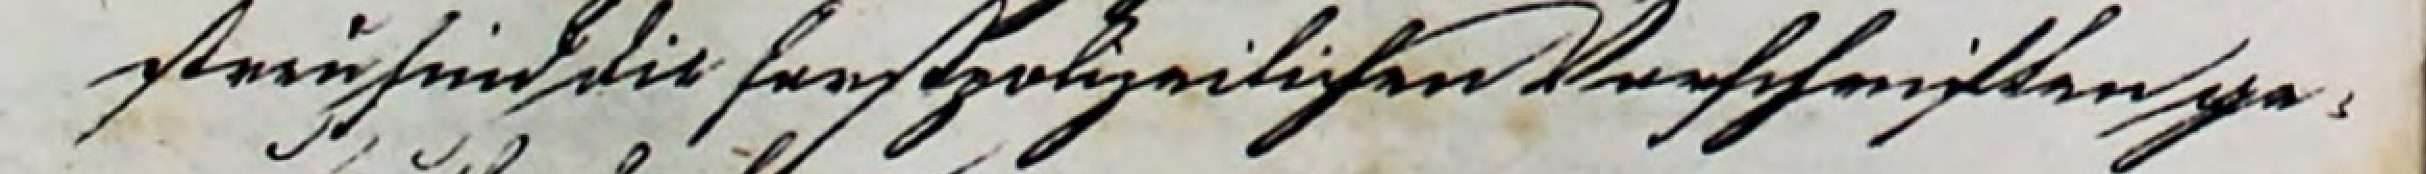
streu sind die forstpolizeilichen Vorschriften ge„
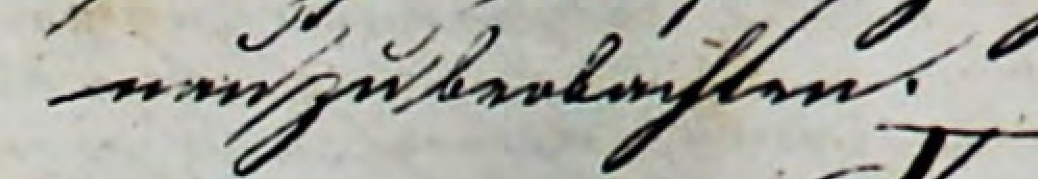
nau zu beobachten.
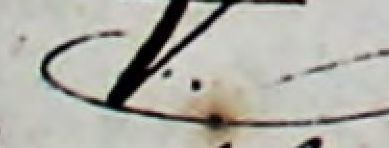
V.
